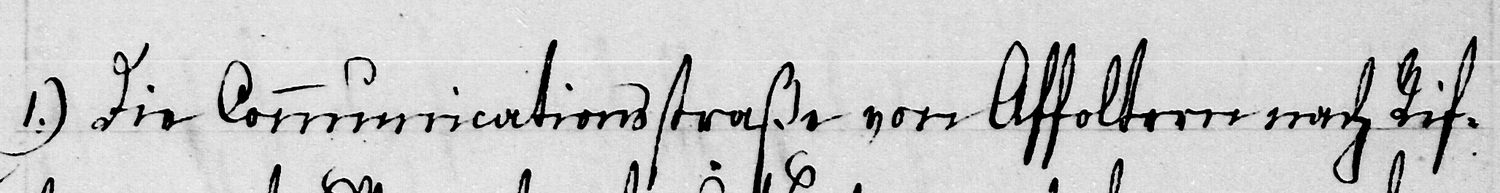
1.) Die Communicationsstraße von Affoltern nach Rif¬
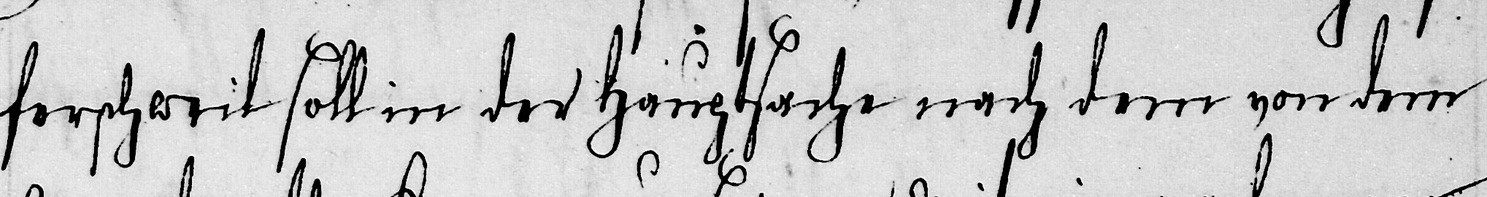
erschweil soll in der Hauptsache nach dem von dem
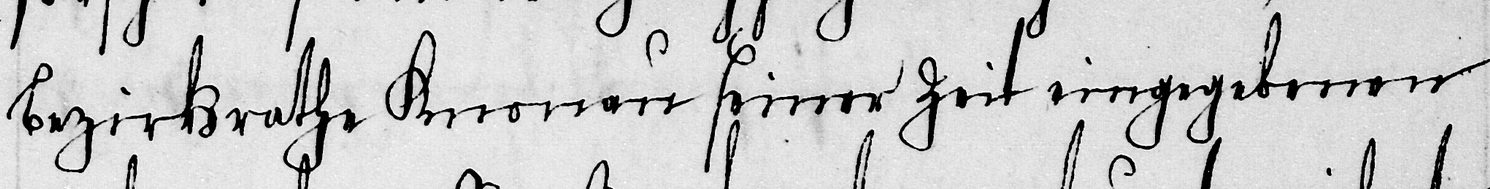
Bezirksrathe Knonau seiner Zeit eingegebenen
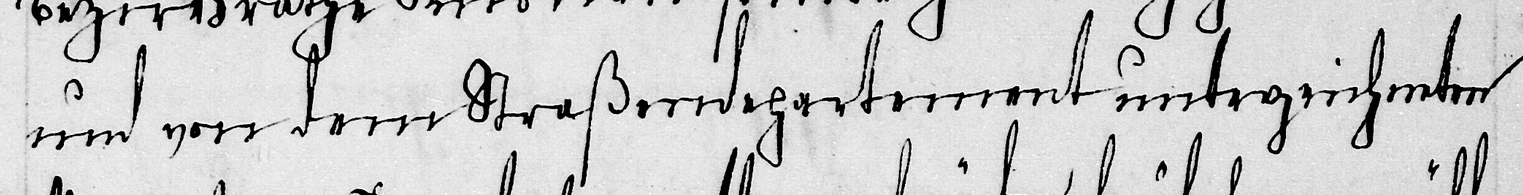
und von dem Straßendepartement unterzeichneten
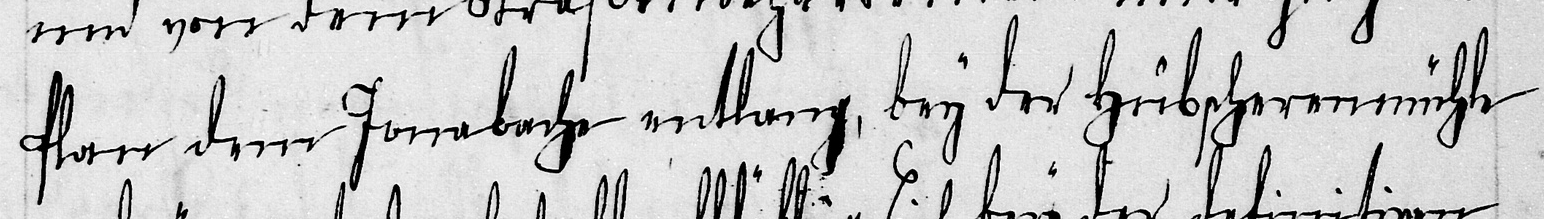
Plan dem Jonabache entlang, bey der Hübscherenmühle
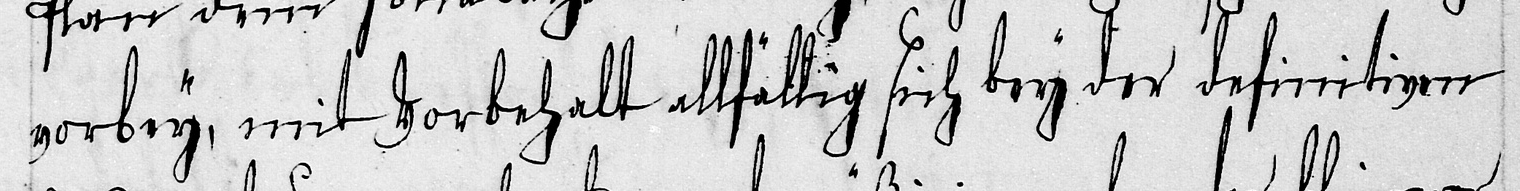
vorbey, mit Vorbehalt allfällig sich bey der definitiven
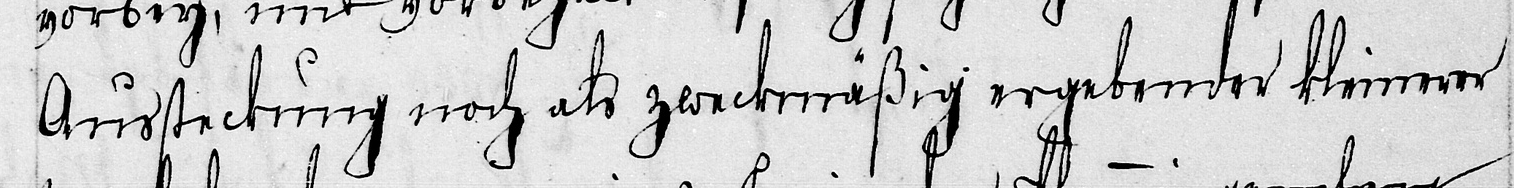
Aussteckung noch als zweckmäßig ergebender kleinerer
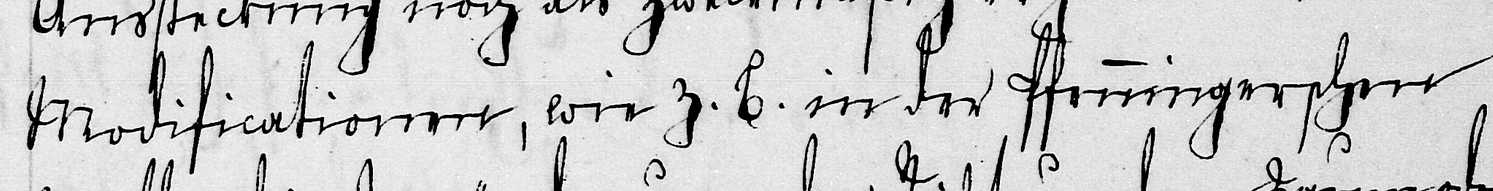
Modificationen, wie z. B. in der Pfenningerschen
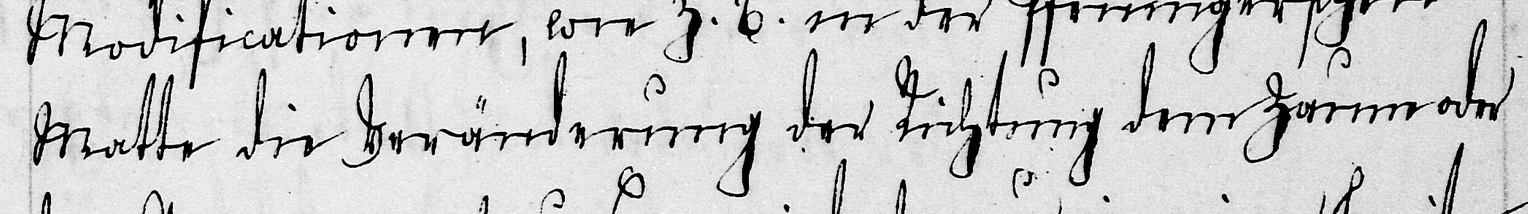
Matte die Veränderung der Richtung dem Zaune oder
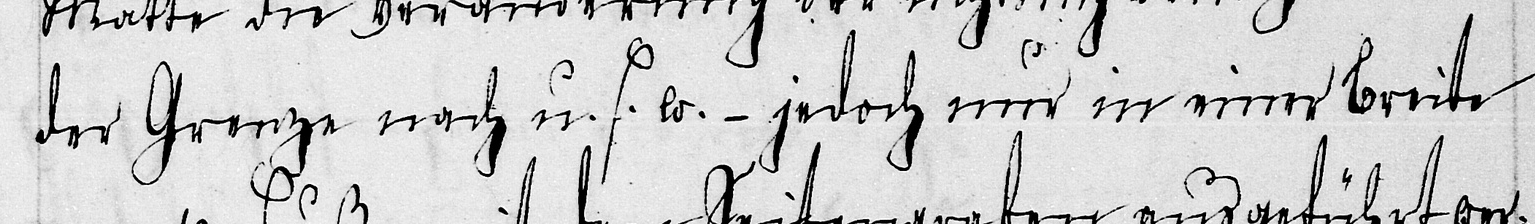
der Grenze nach u. s. w. – jedoch nur in einer Breite
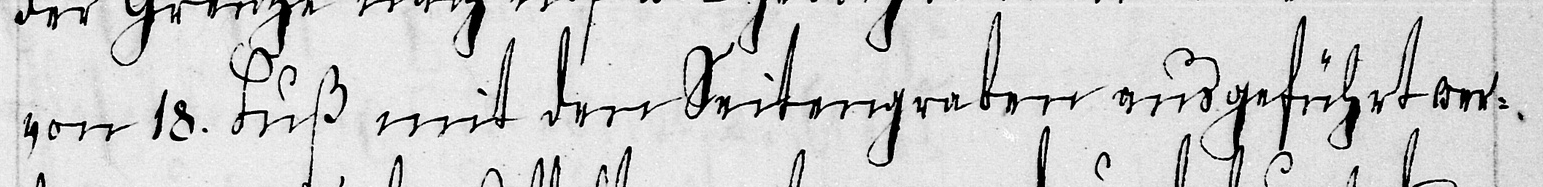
von 18. Fuß mit den Seitengraben ausgeführt wer¬
